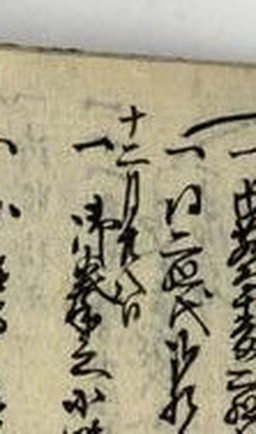十二月廿八日
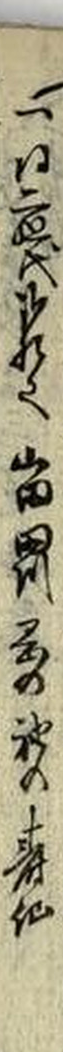一同二組代弐拾匁山田田川岡の袖の寿仙
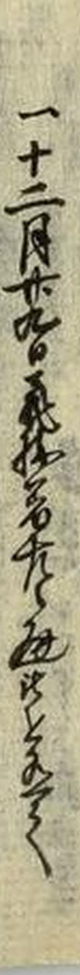一十二月廿九日飛脚着左之通被進有之
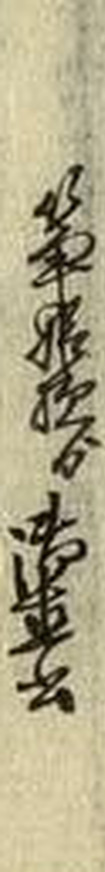箏姫様ゟ御直書
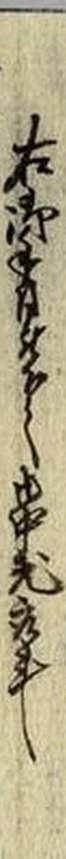右御手自被下之御中老取斗
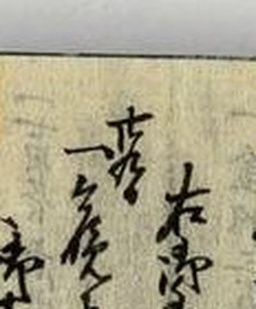廿九日
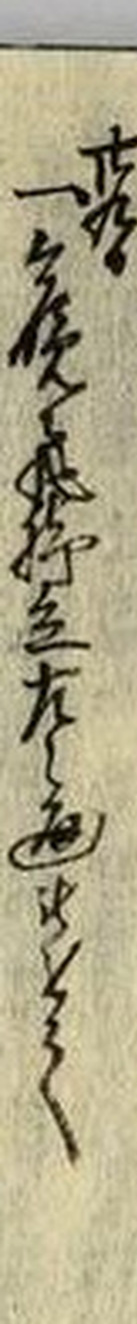一今晩飛脚立左之通被進之
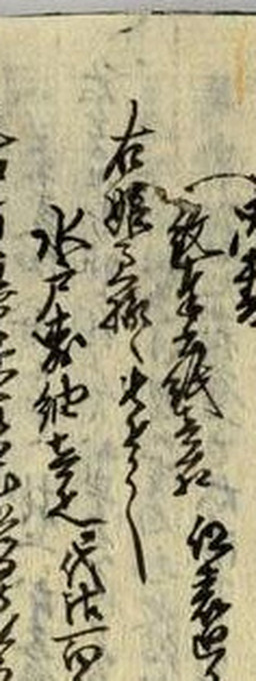右姫君様へ被進之
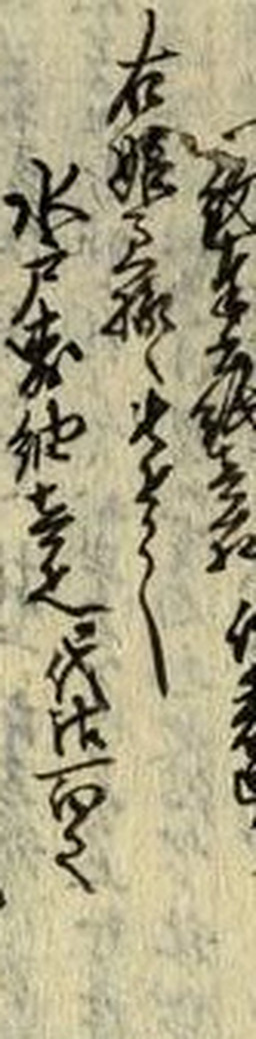水戸森紬壱疋代銀百匁
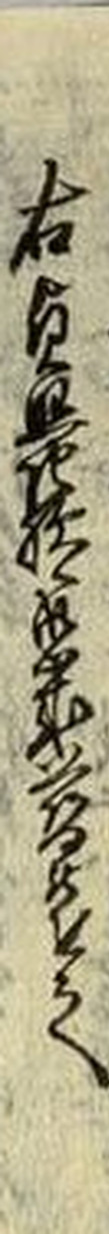右貞照院様へ御歳暮被進之
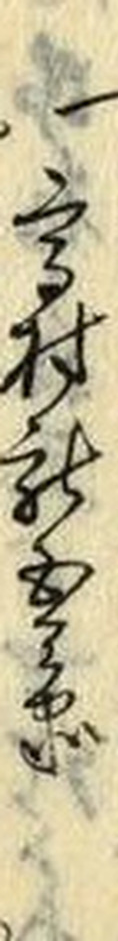高村新五兵衛
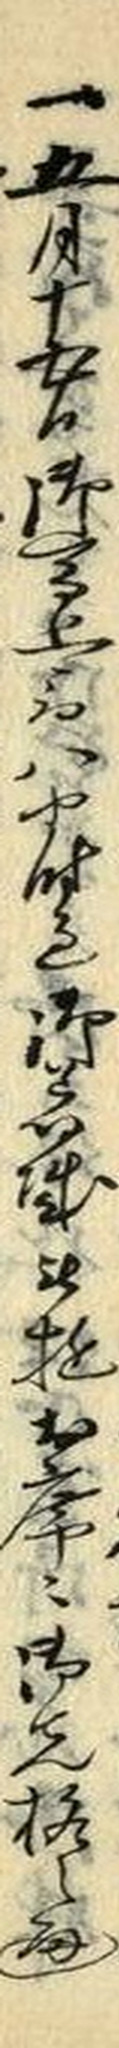一五月十五日御馬上ニ而八半時過御着城被遊於席々御先格之通
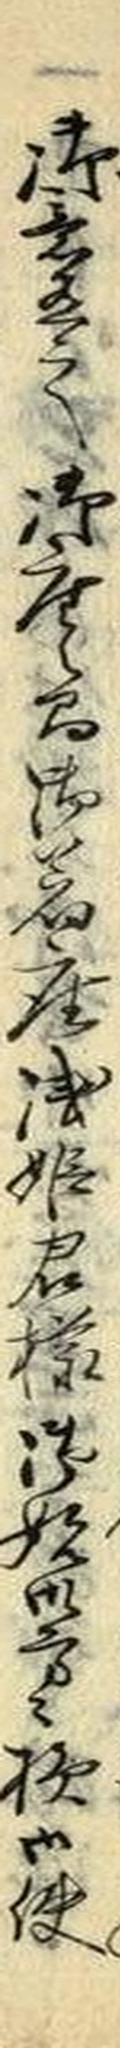御意有之御座之間御着座浅姫君様御始御方々様御使
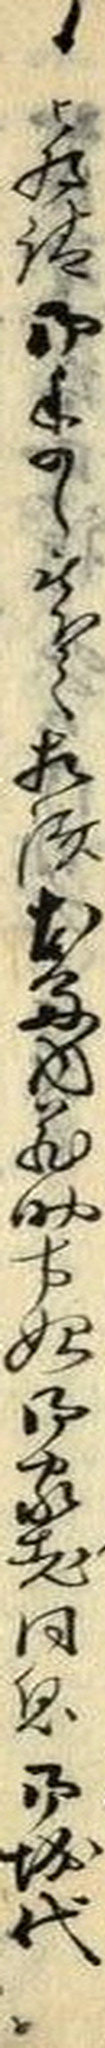被為請御手のし被下相済本多内蔵助方始御家老同息御城代
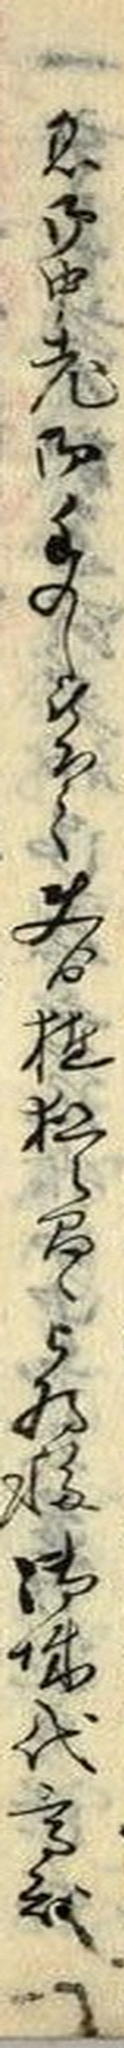息御中老御手のし被下之夫ゟ韃靼之間へ被為移御城代高知
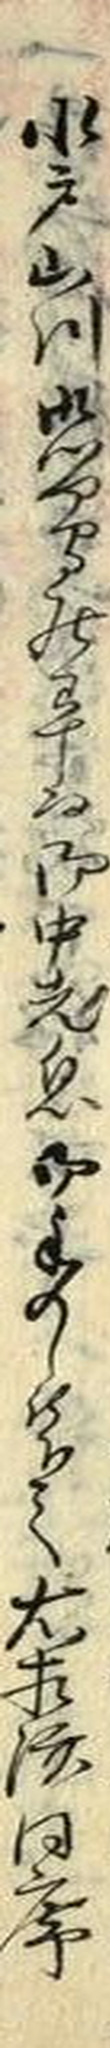水戸山川御留守居畢而御中老息御手のし被下之右相済同席
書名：少傅日録抄（斉承付側向頭取日記、在国）
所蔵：福井県文書館 Fukui Prefectural Archives
